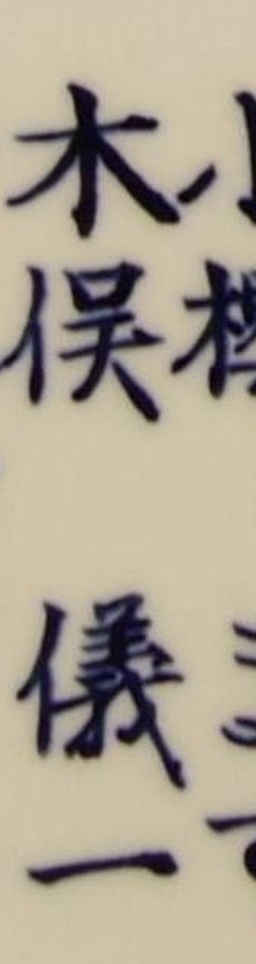木俣儀一
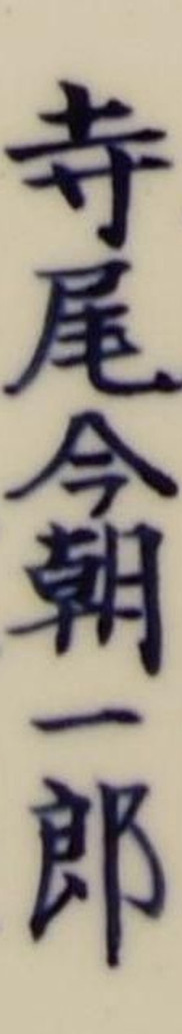寺尾今朝一郎
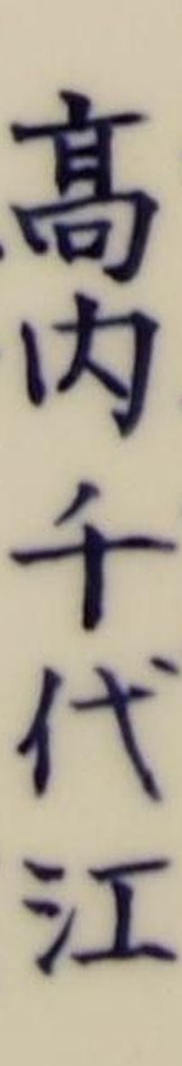高内千代江
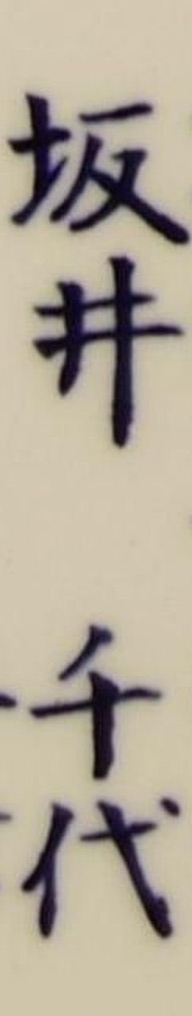坂井千代
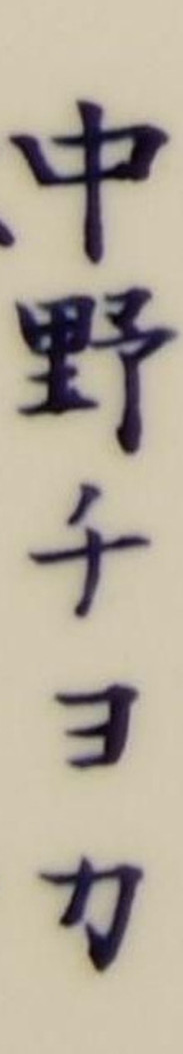中野チヨカ
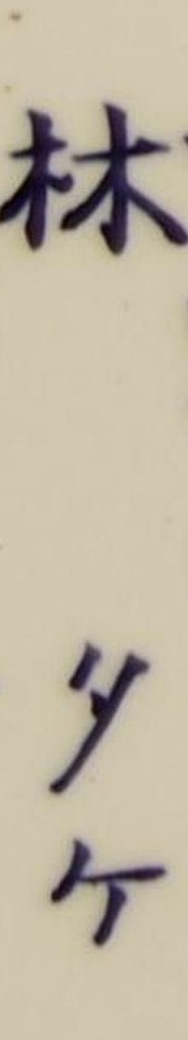林タケ
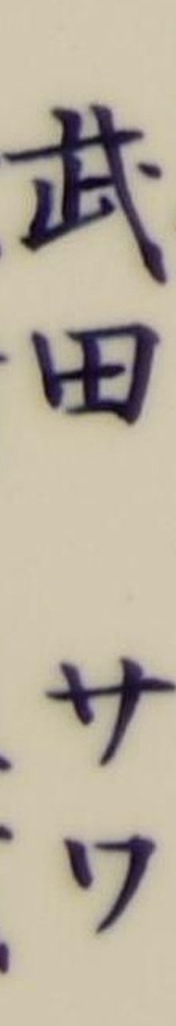武田サワ
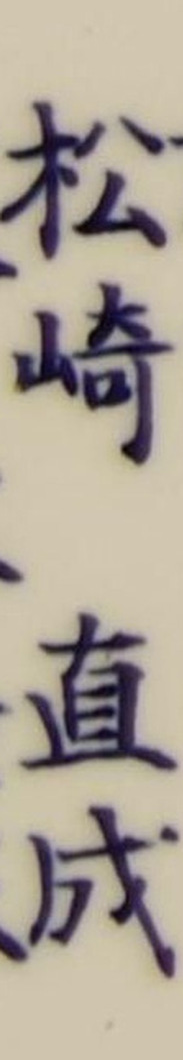松崎直成
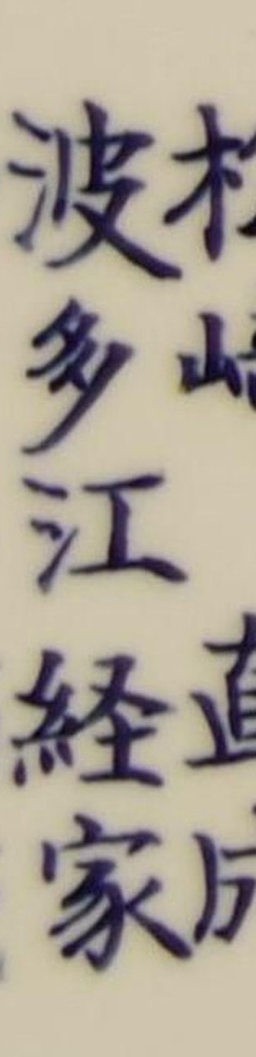波多江経家
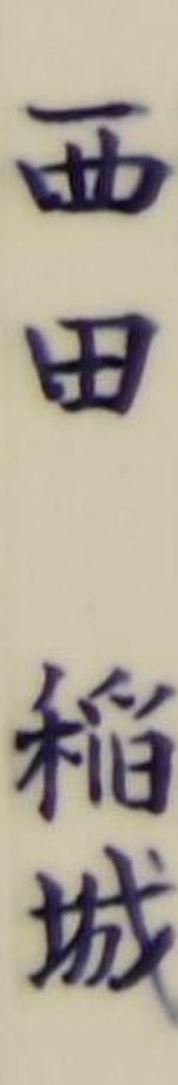西田稲城

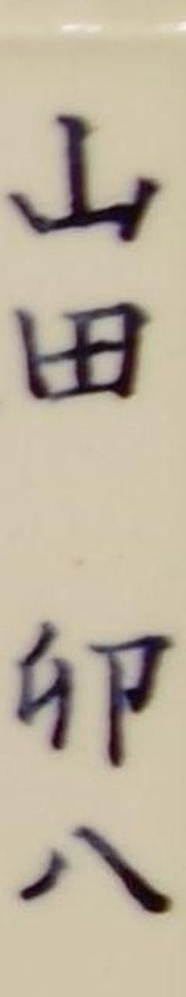山田卯八
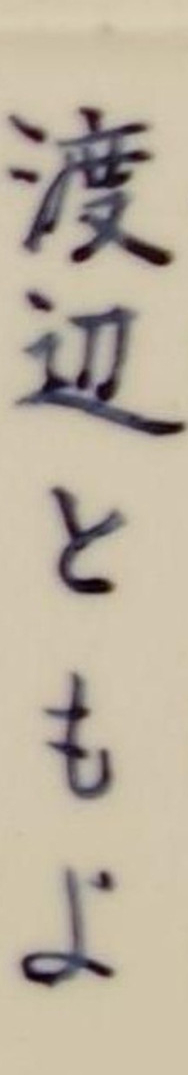渡辺ともよ
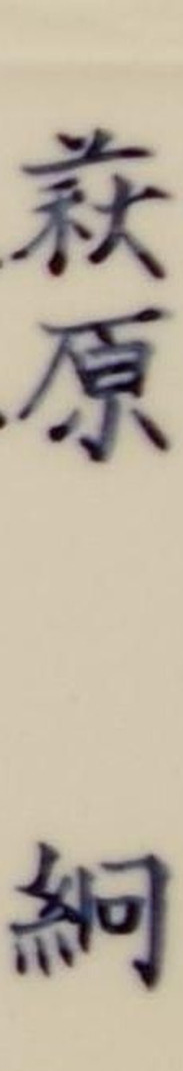萩原絅
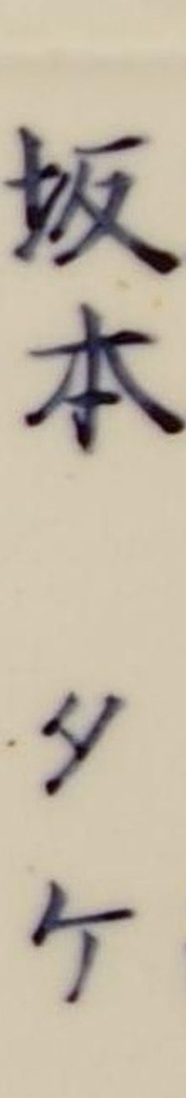坂本タケ
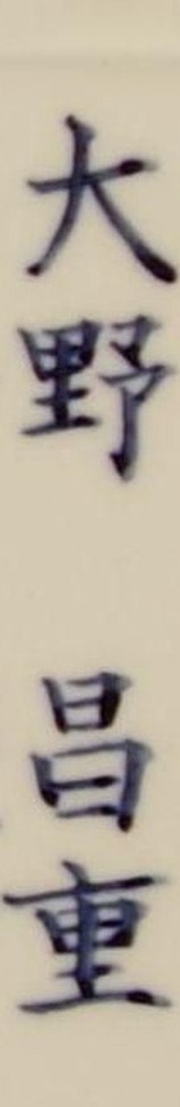大野昌重
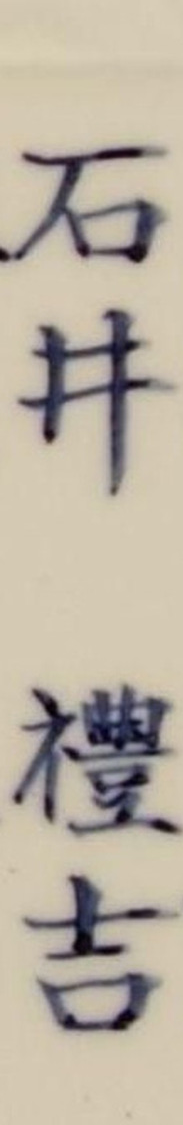石井禮吉
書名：A~D
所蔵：koyasan kongobuji
